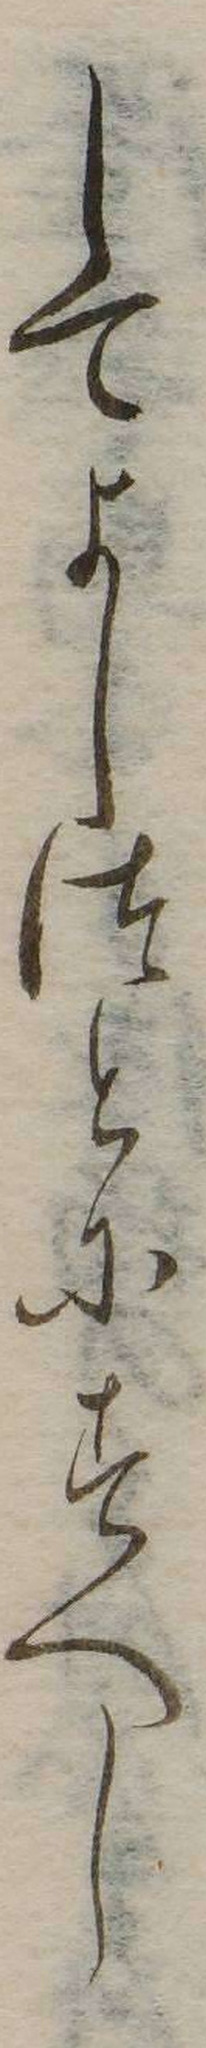してよしつとにすへし

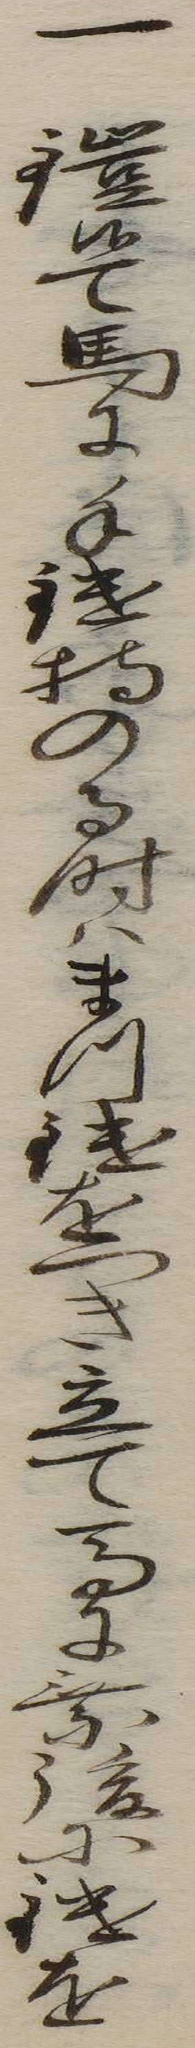一鎧候て馬にて鑓持のる時はまつ鑓をつき立て馬に乗後に鑓を
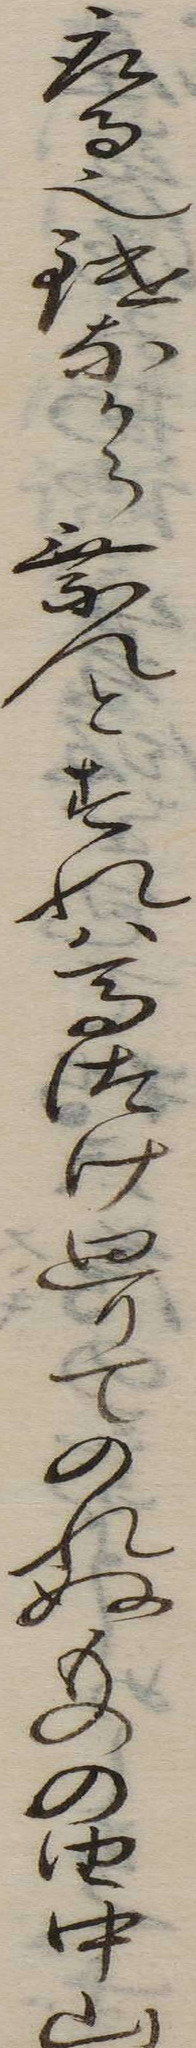取る也鑓なから乗んとすれは馬つけ廻りてのれぬものの由中山
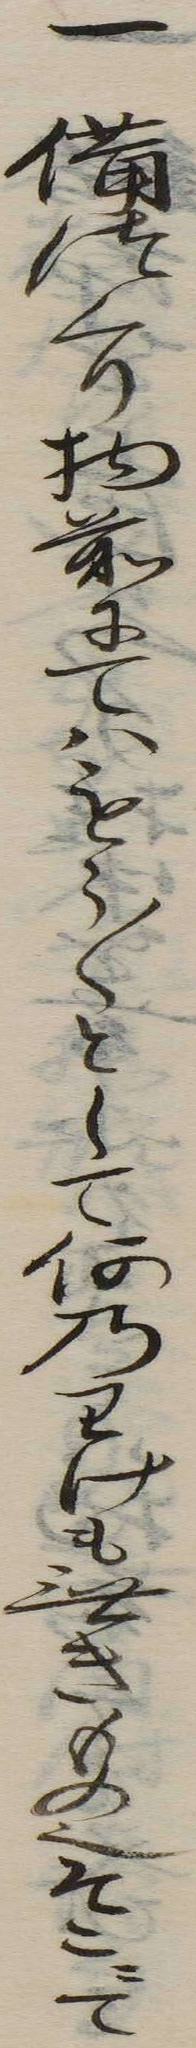一備つくり物前にてはもう〳〵として何のわけも無きもの也そこにて
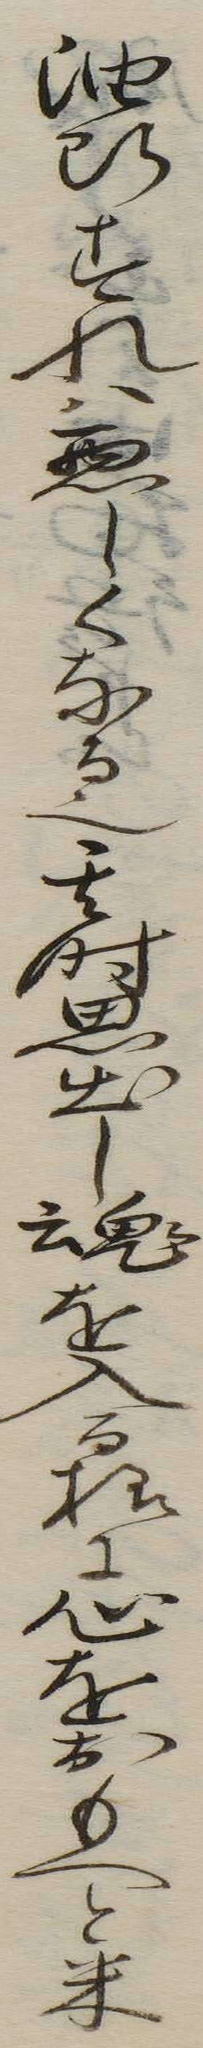油断をすれは悪しくなる也其時思出し魂を入る様に心をおもへと米
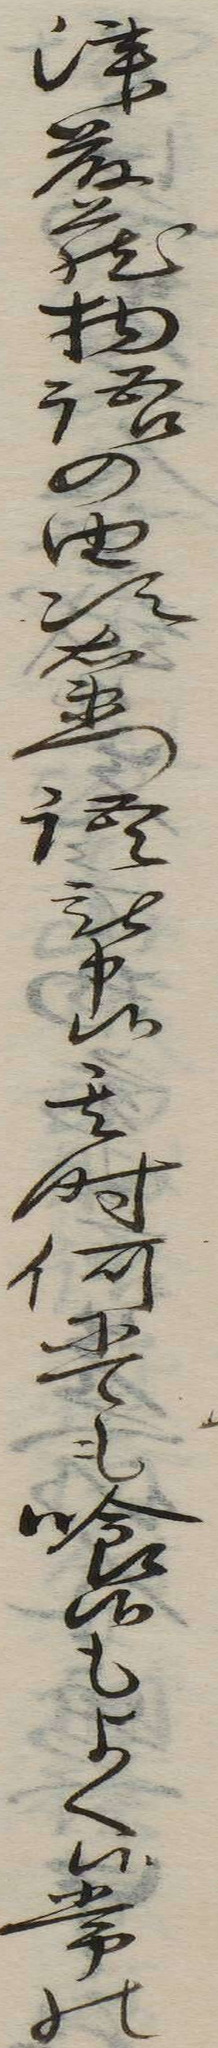津藤蔵物語の由次右衛門語被申候其時何にても喰候もよく候常の
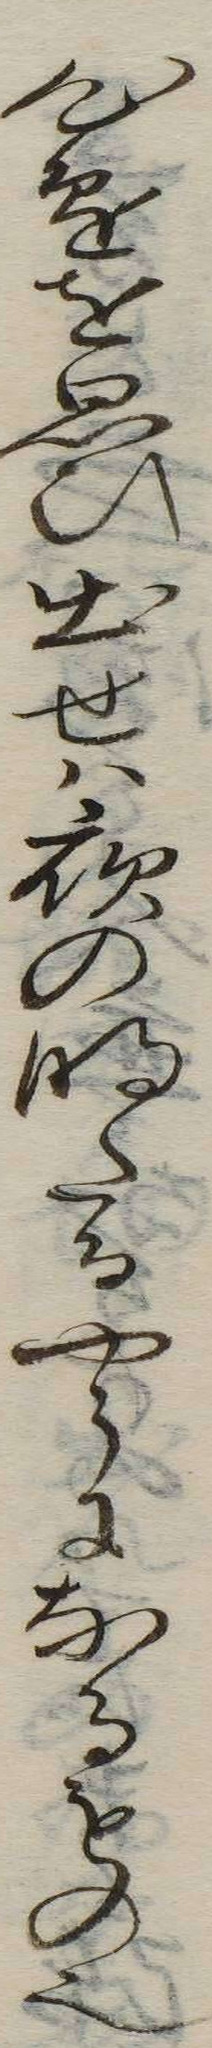心懸を思ひ出せは夜の明たるやうになるもの也
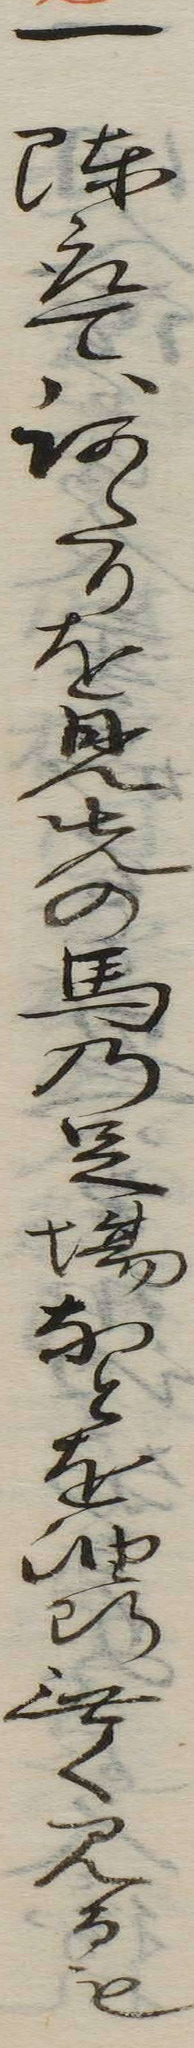一陣取てはあたりを見先の馬の足場なとを油断無く見るも
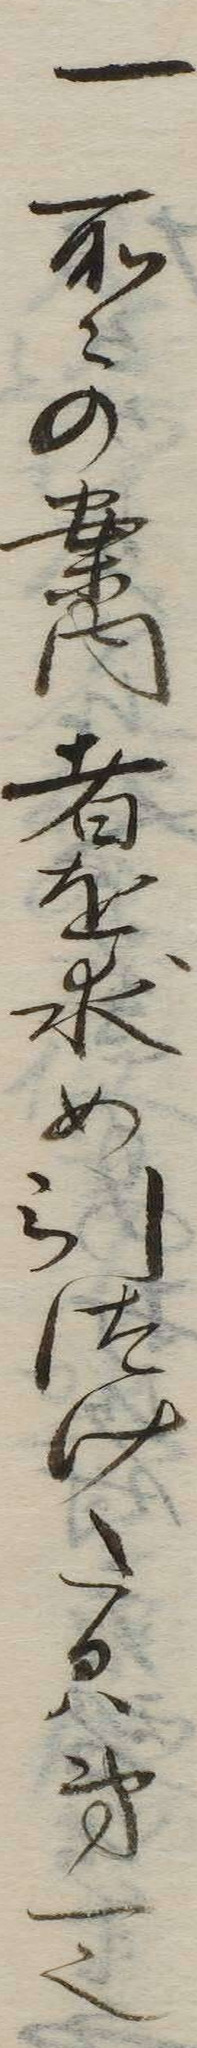一所々の案内者を求め引つけたるは第一也
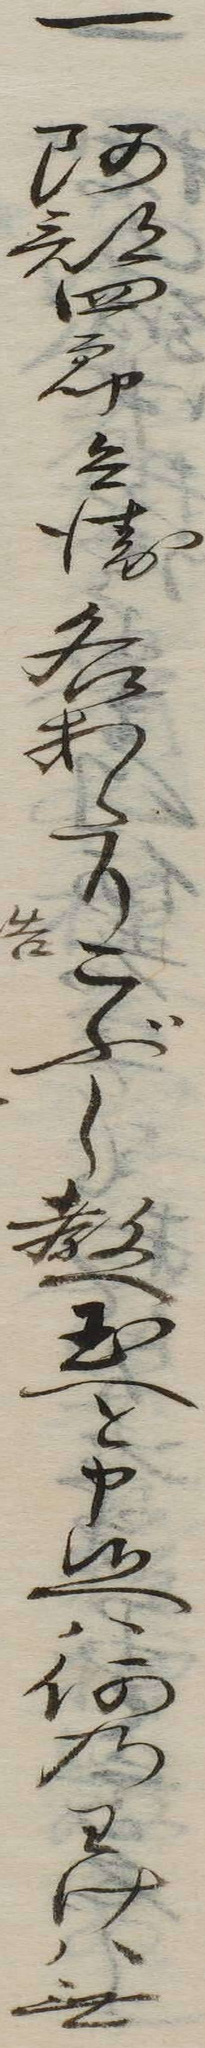一阿部四郎兵衛各あたりこぶし教え玉へと申候へは何のわけは無
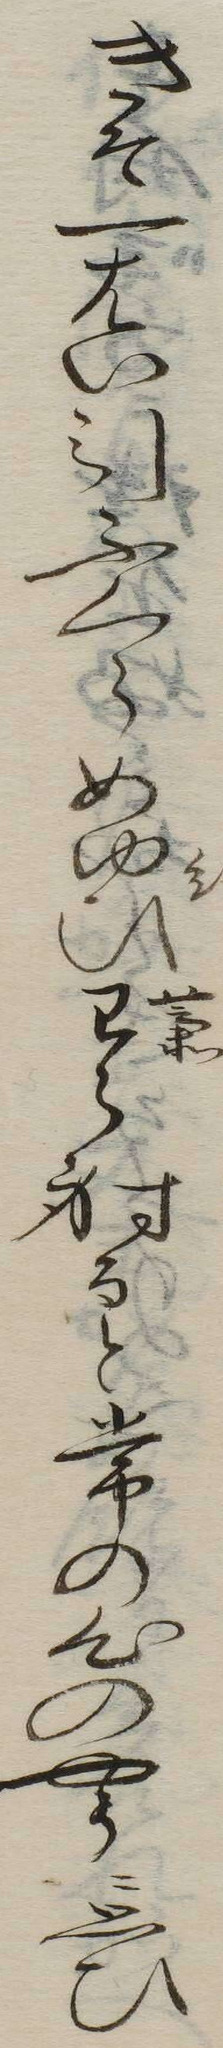きそ一はい引ふくらめゆひわら射ると常の心のやうに思ひ
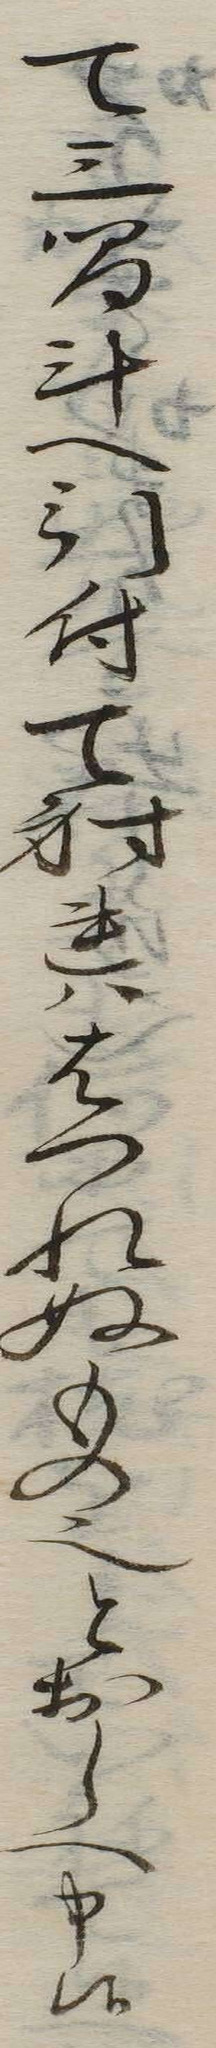て三間斗へ引付て射れははつれぬもの也とおしへ申候
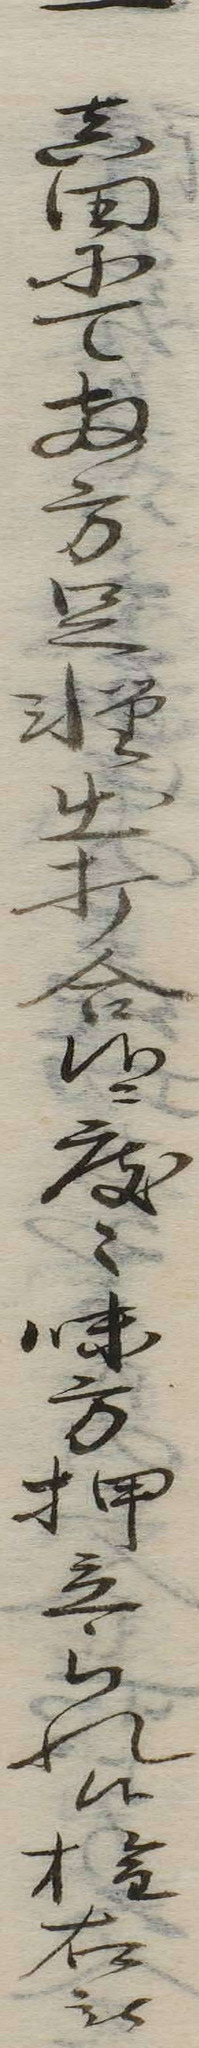一真田にて両方足軽出打合候に度々味方押立られ候権右被
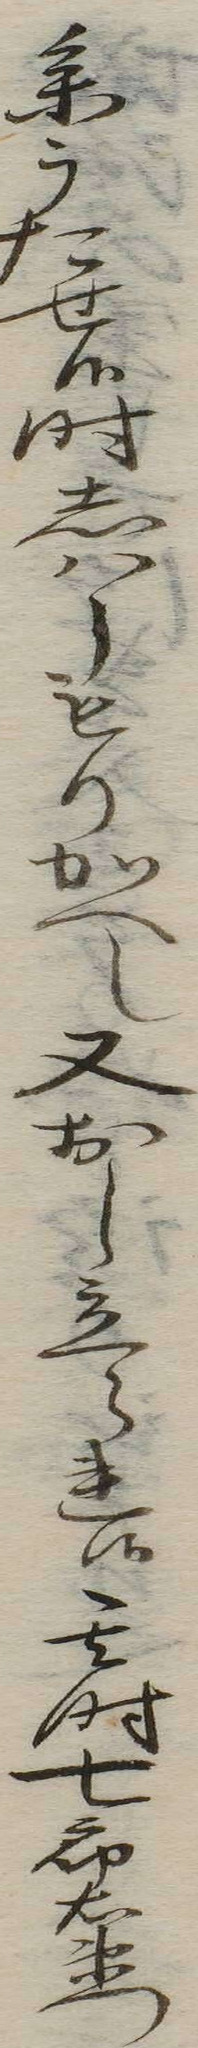参うたせ候時しはしもりかへし又おし立られ候其時七郎右衛門
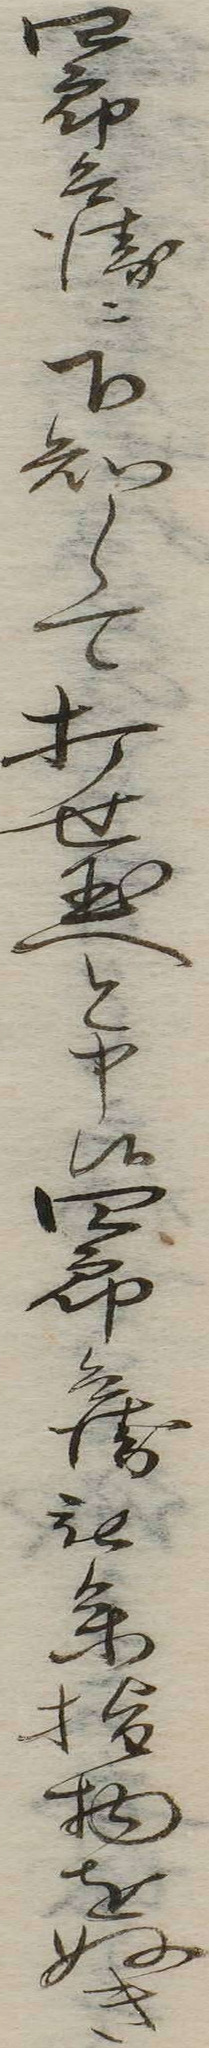四郎兵衛に下知して打せ玉へと申候四郎兵衛被参指物をぬき
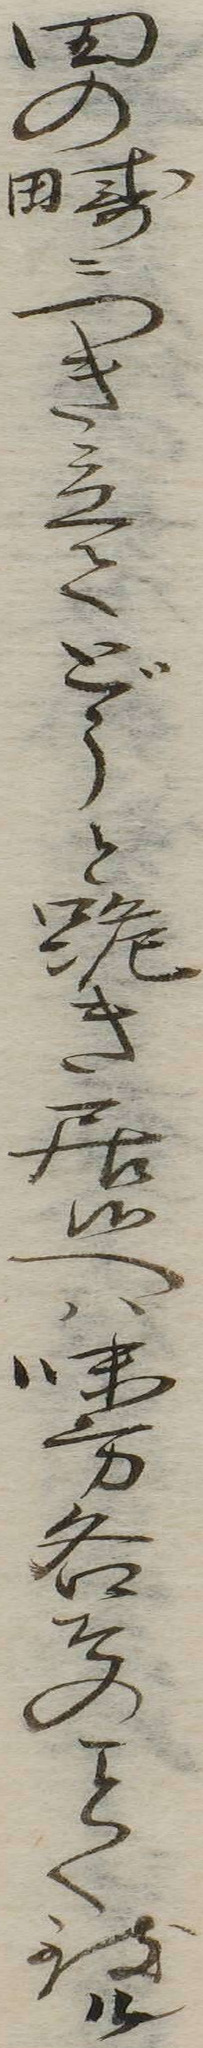田の畦につき立てどうと跪き居候へは味方各そのことく致ル
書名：三河之物語
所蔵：国文学研究資料館
